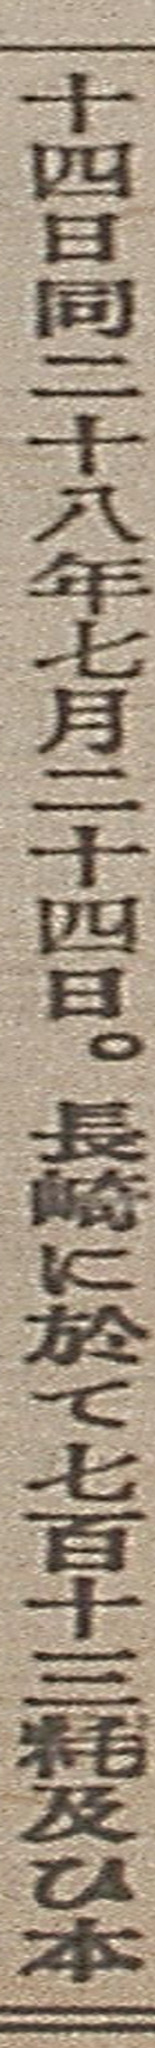十四日同二十八年七月二十四日。長﨑に於て七百十三粍及ひ本
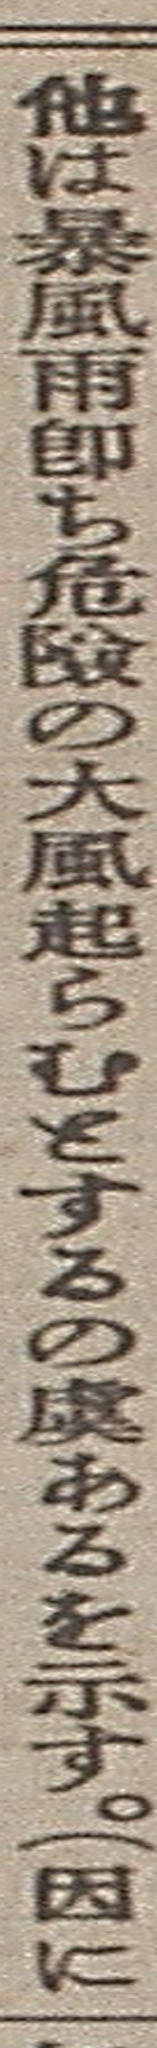他は暴風雨即ち危険の大風起らむとするの虞あるを示す。（因に
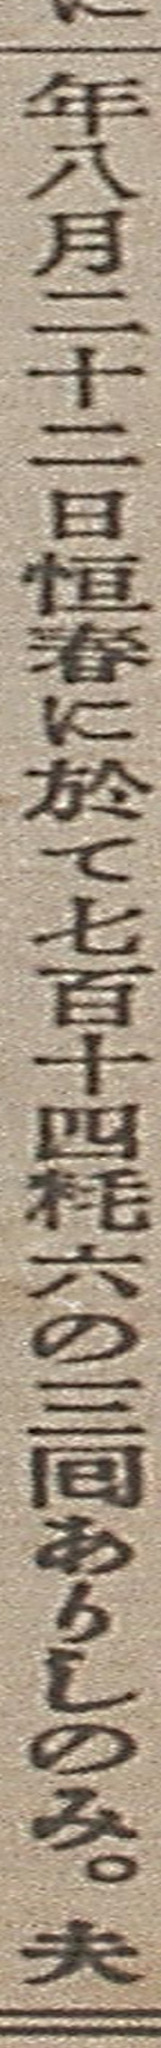年八月二十二日恒春に於て七百十四粍六の三回ありしのみ。夫
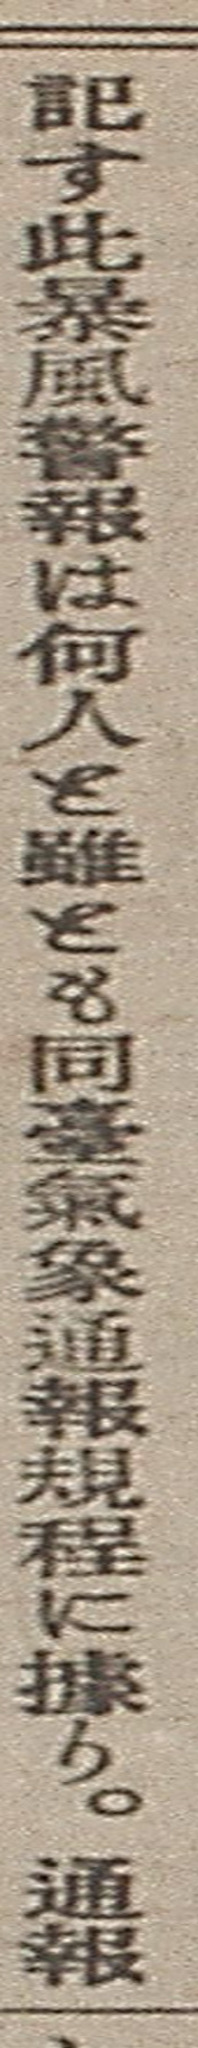記す此暴風警報は何人と雖とも同台気象通報規程に拠り。通報
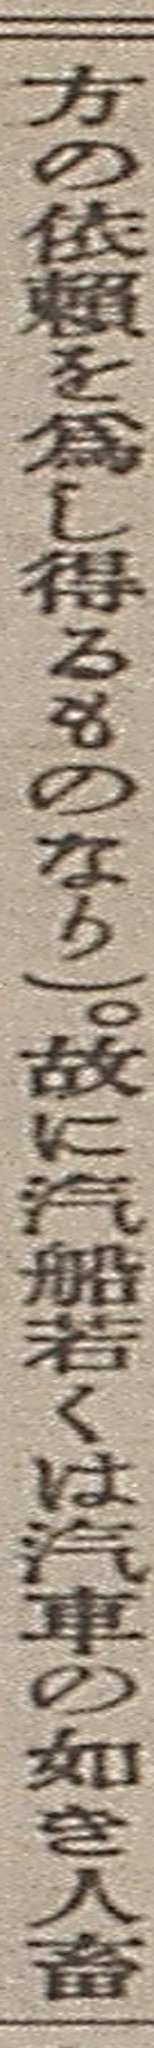方の依頼を為し得るものなり）。故に汽船若くは汽車の如き人畜
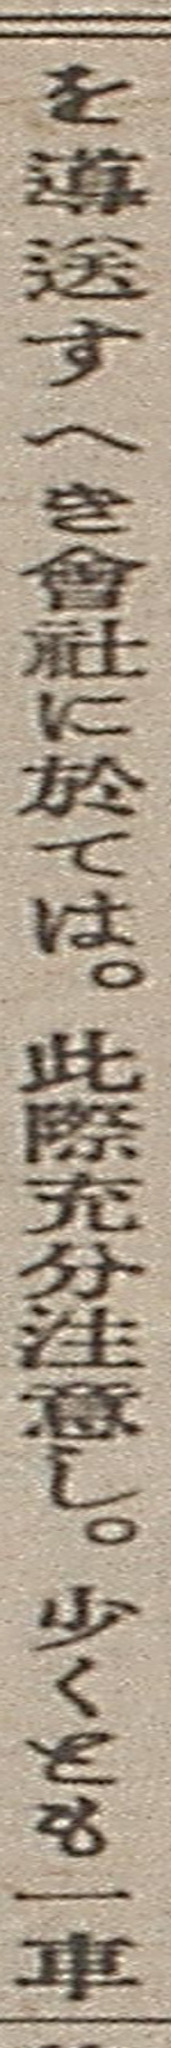を導送すへき会社に於ては。此際充分注意し。少くとも一車
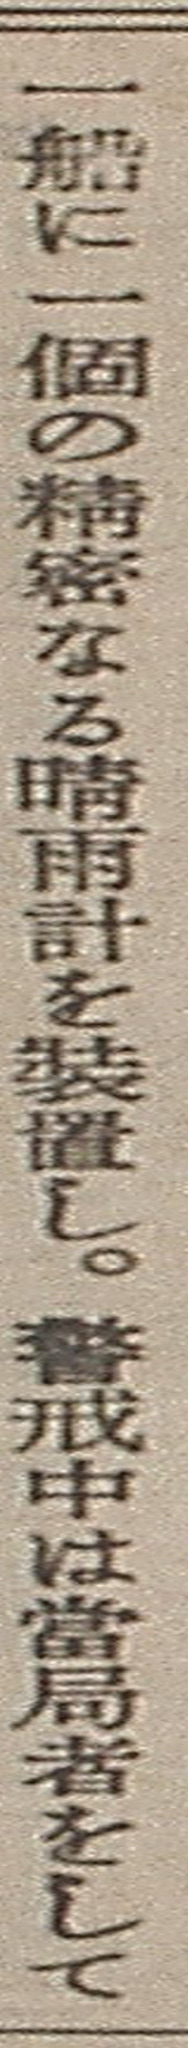一船に一個の精密なる晴雨計を装置し。警戒中は当局者をして
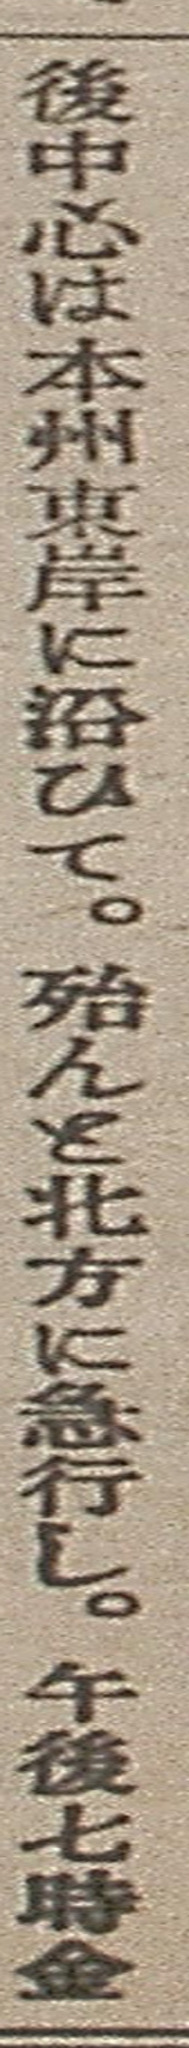後中心は本州東岸に沿ひて。殆んと北方に急行し。午後七時金
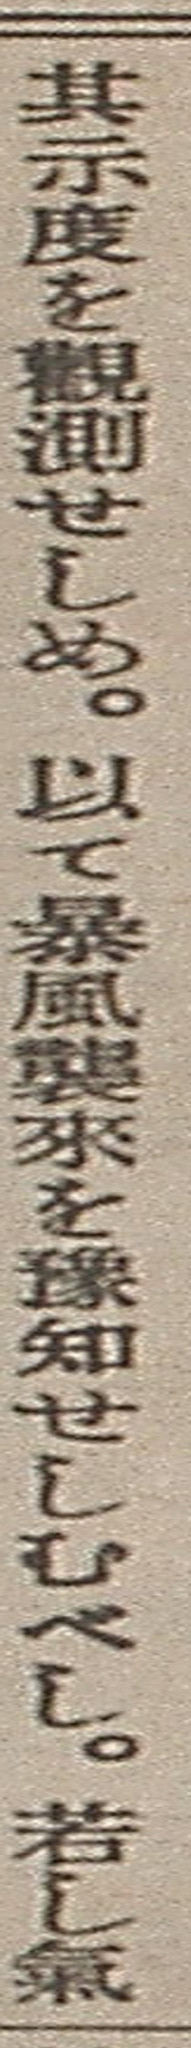其示度を観測せしめ。以て暴風襲来を予知せしむべし。若し気
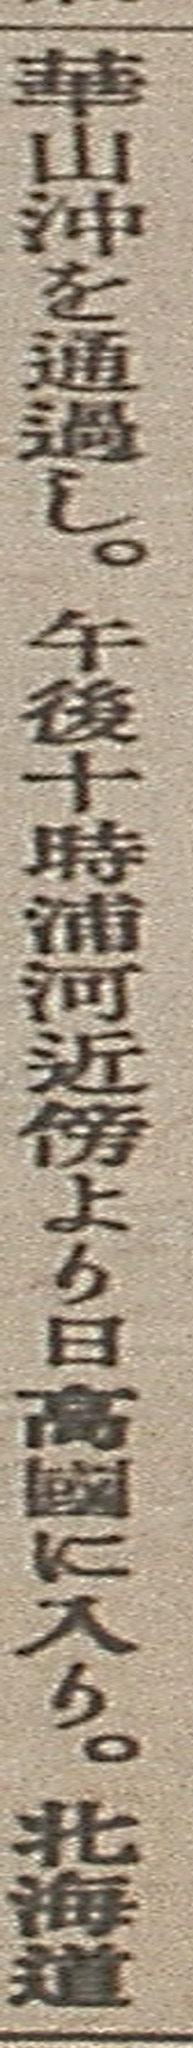華山沖を通過し。午後十時浦河近傍より日高国に入り。北海道
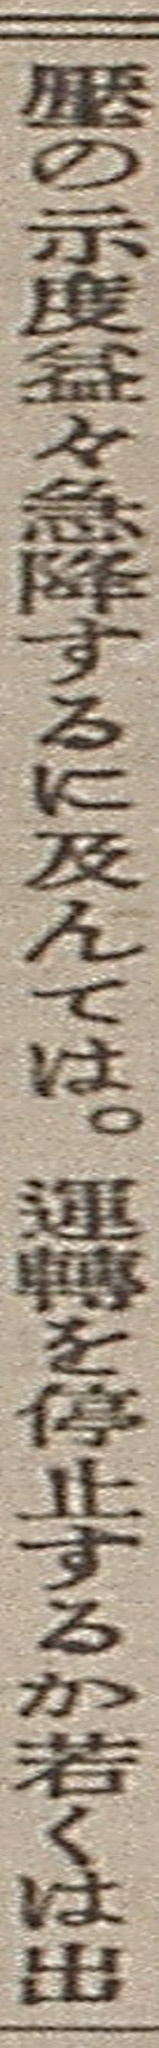圧の示度益々急降するに及んては。運転を停止するか若くは出
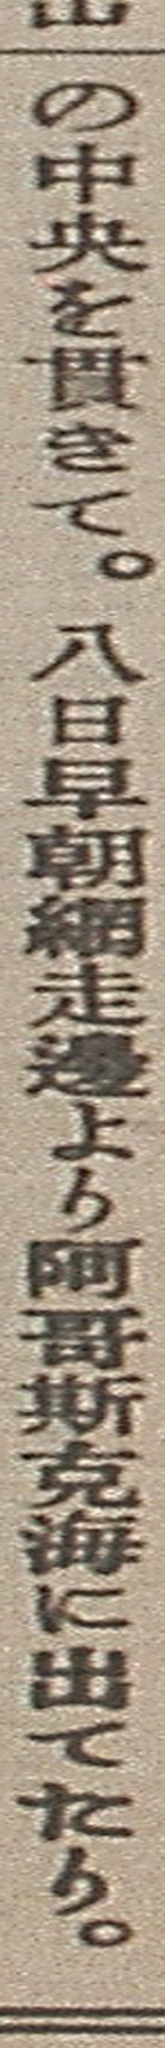の中央を貫きて。八日早朝網走辺より阿哥斯克海に出てたり。
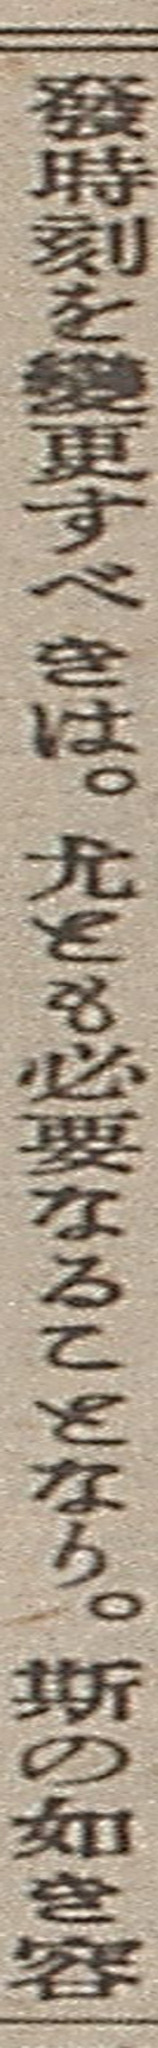発時刻を変更すべきは。尤とも必要なることなり。斯の如き容
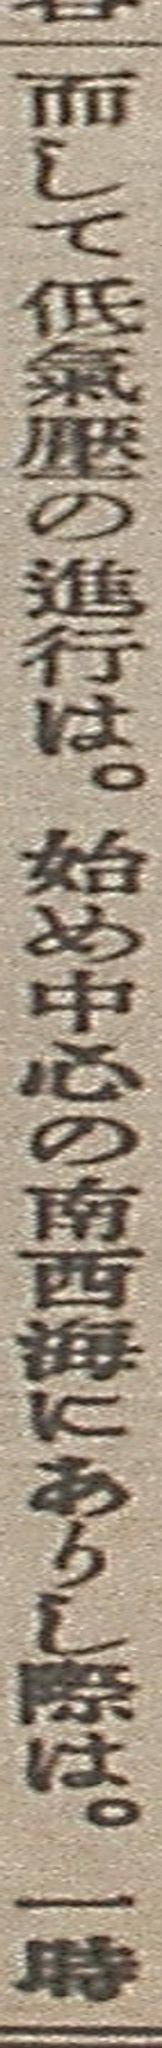而して低気圧の進行は。始め中心の南西海にありし際は。一時
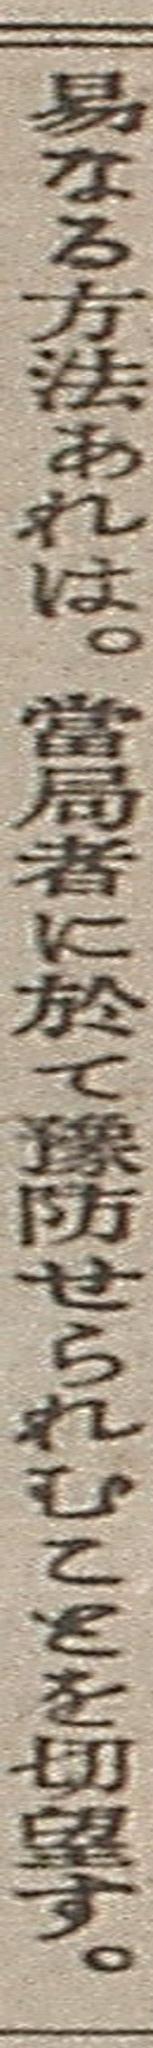易なる方法あれは。当局者に於て予防せられむことを切望す。
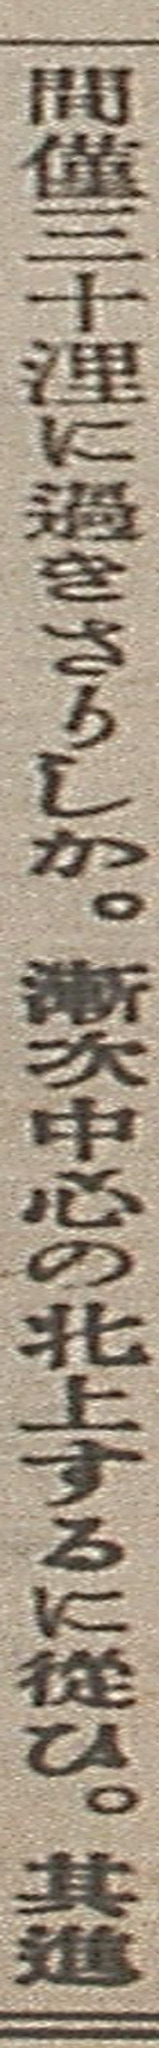間僅三十浬に過きさりしか。漸次中心の北上するに従ひ。其進
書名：風俗畫報臨時増刊第百九十九號　明治三十二年十月各地災害圖會（前編之續）
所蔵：東京大学地震研究所図書室 Earthquake Research Institute Library, The University of Tokyo, JAPAN
